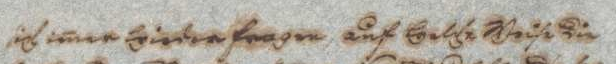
sich immer wieder fragen, auf welche Weise die
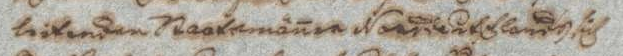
leitenden Staatsmänner Norddeutschlands sich
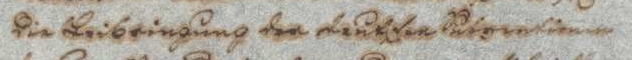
die Beibringung der deutschen Subventionen
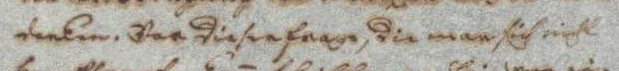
denken. Vor dieser Frage, die man sich nicht
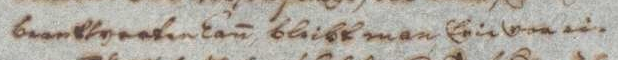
beantworten kann, bleibt man wie vor ei-
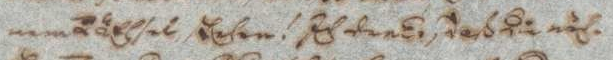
nem Räthsel stehen! Ich denke, daß die näch-
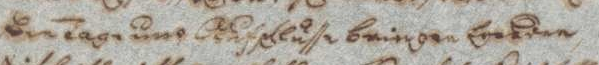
sten Tage uns Aufschlüsse bringen werden,
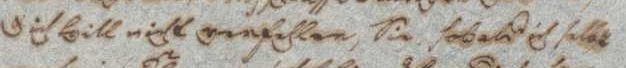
& ich will nicht verfehlen, Sie, sobald ich selbst
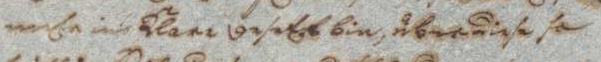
mehr in's Klare gesetzt bin, über diese so
